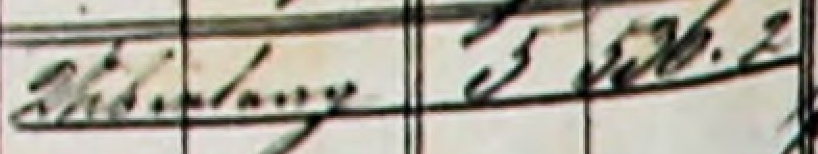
Uebertrag 5 536.2
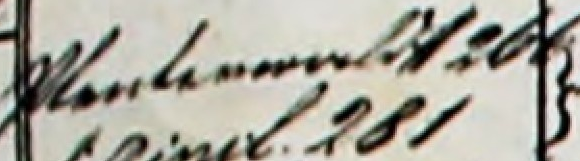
Plenterwald Nr 66
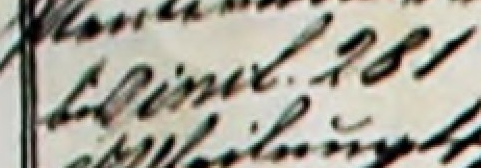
bis incl. 281
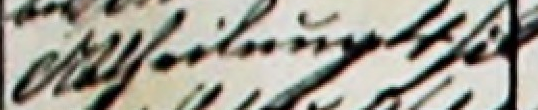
Abtheilung 4 ???
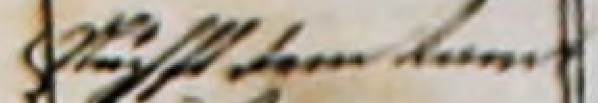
Nächst dem Land„
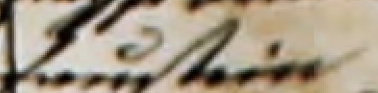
haustein
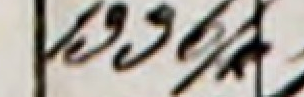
1336/k
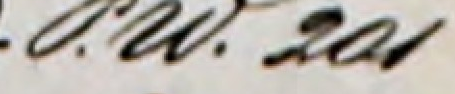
P.W. 201
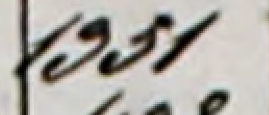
1351
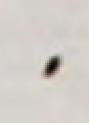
„
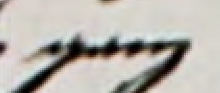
ganz
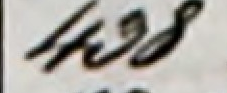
438
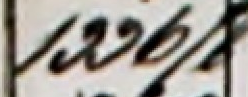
1336/l
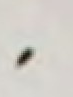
„
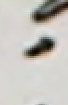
„
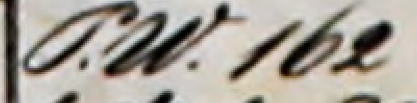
P.W. 162
